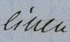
Weishaupt
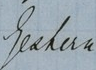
welcher
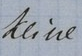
sich über
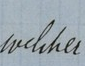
gar keine
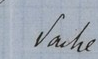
heiten
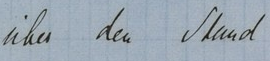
über den Stand
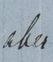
der
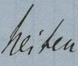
Sache
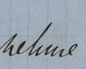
befriedigt
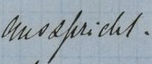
ausspricht.
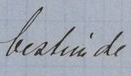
diess nicht
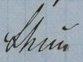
wenn
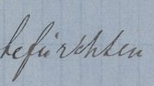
befürchten u
